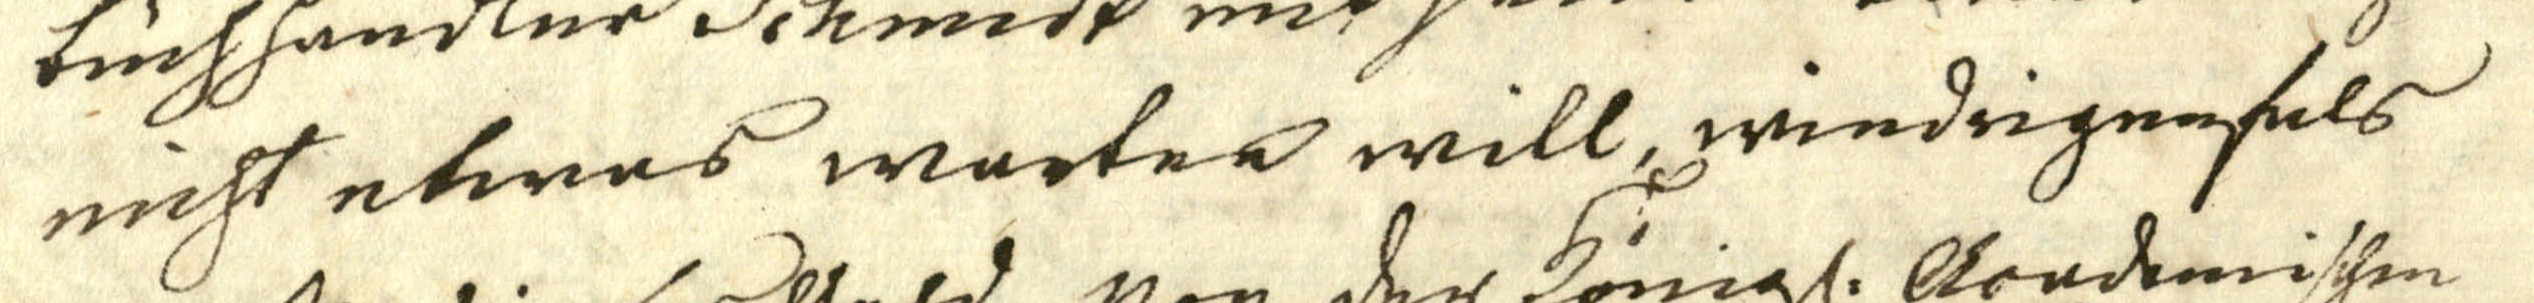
nicht etwas warten will, wiedrigenfals
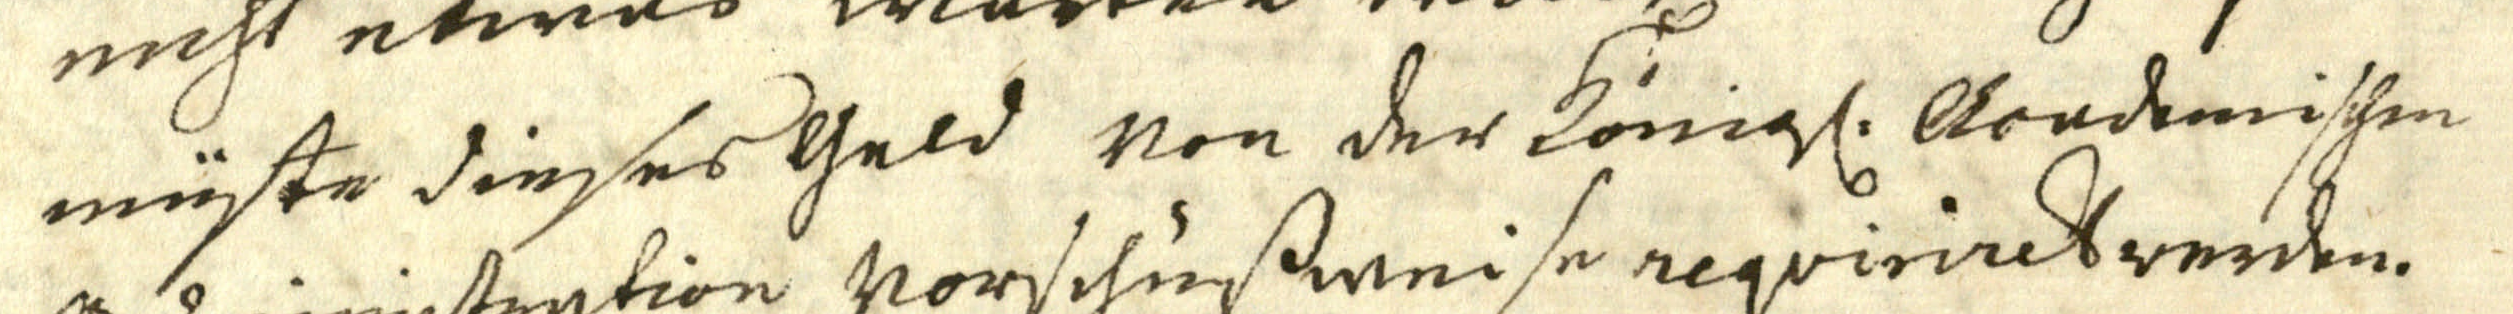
müste dieses Geld von der Königl. Academischen
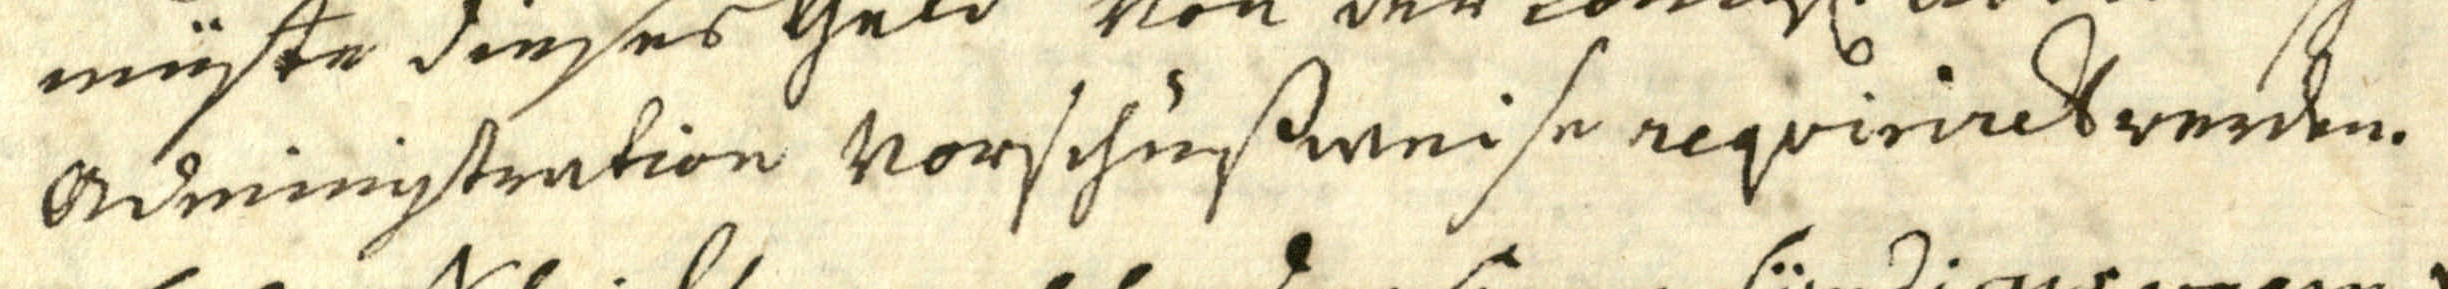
Administration vorschußweise requiriret werden.
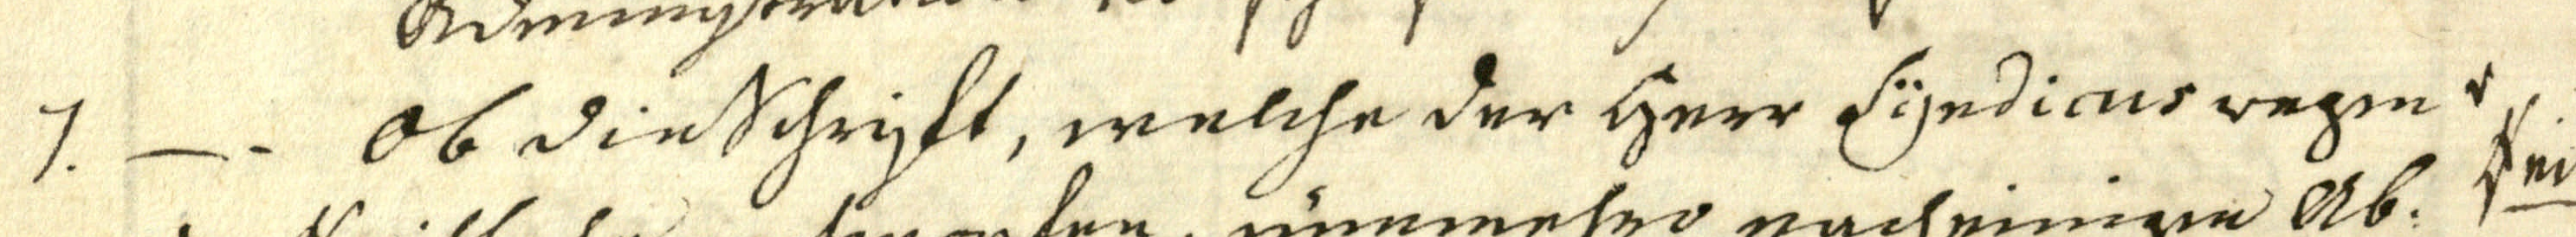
7. ob die Schrift, welche der Herr Sÿndicus wegen
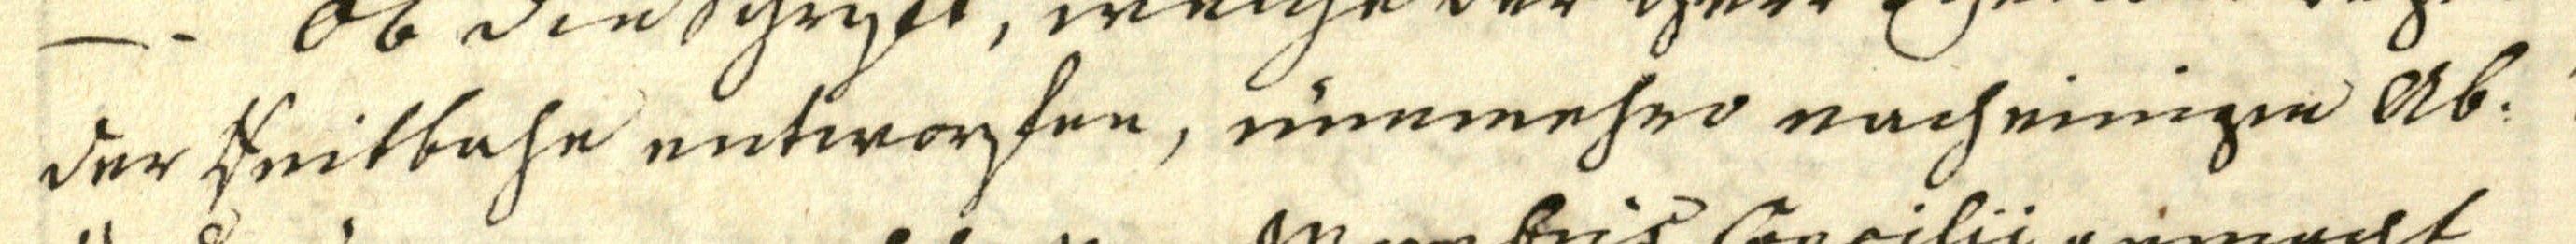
der Reitbahn entworfen, nunmehro nach einigen Ab¬
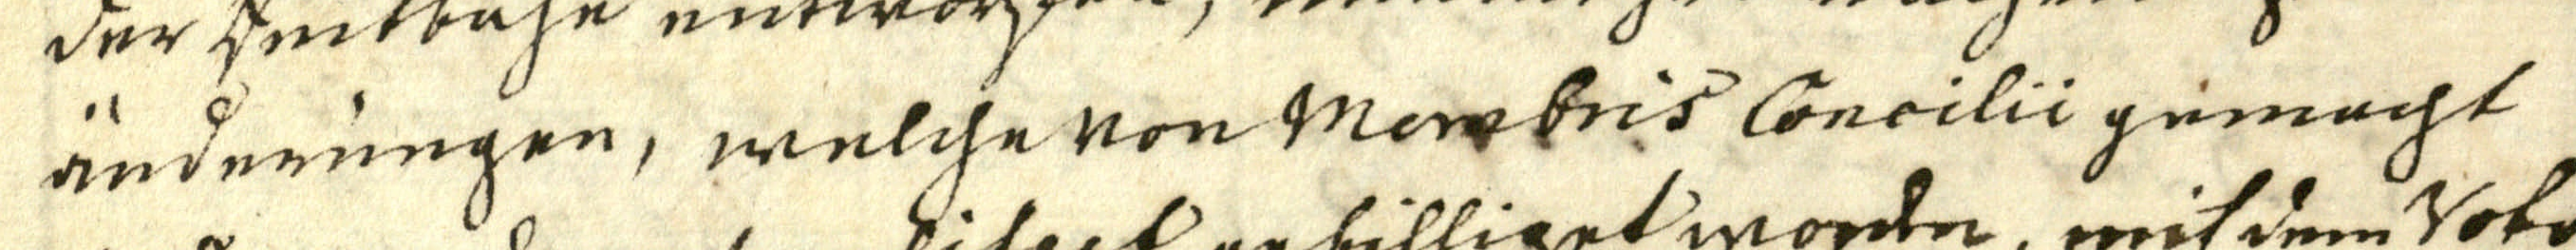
änderungen, welche von Membris Concilii gemacht
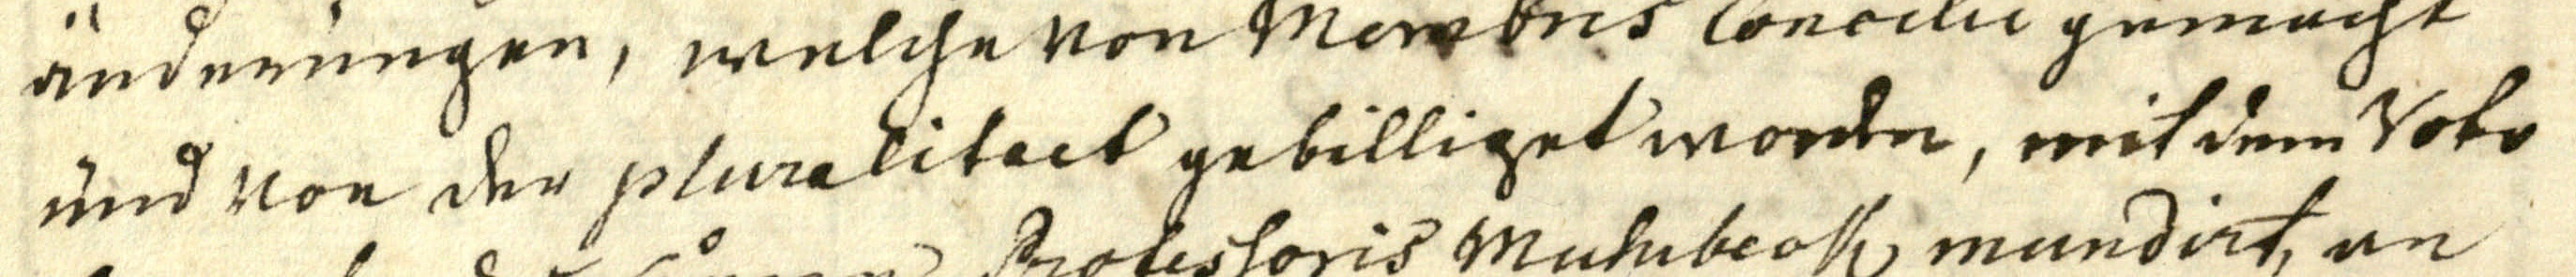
und von der pluralitaet gebilliget worden, mit dem Voto
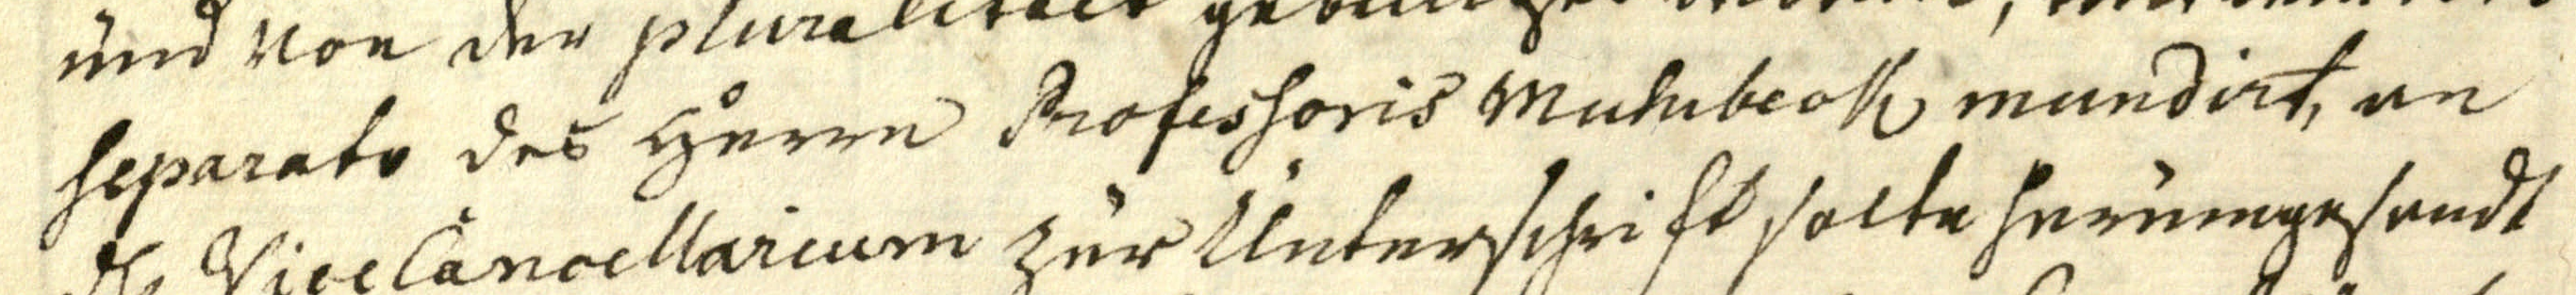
separato des Herrn Professoris Muhrbeck mundirt, an
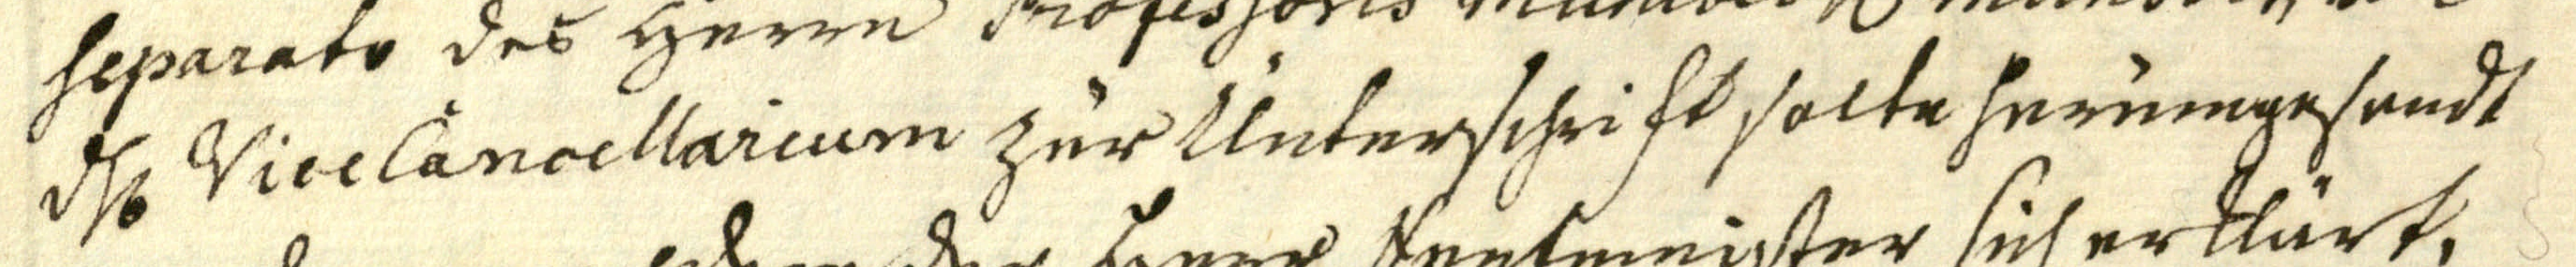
dh Vice Cancellarium zur Unterschrift solte herumgesandt
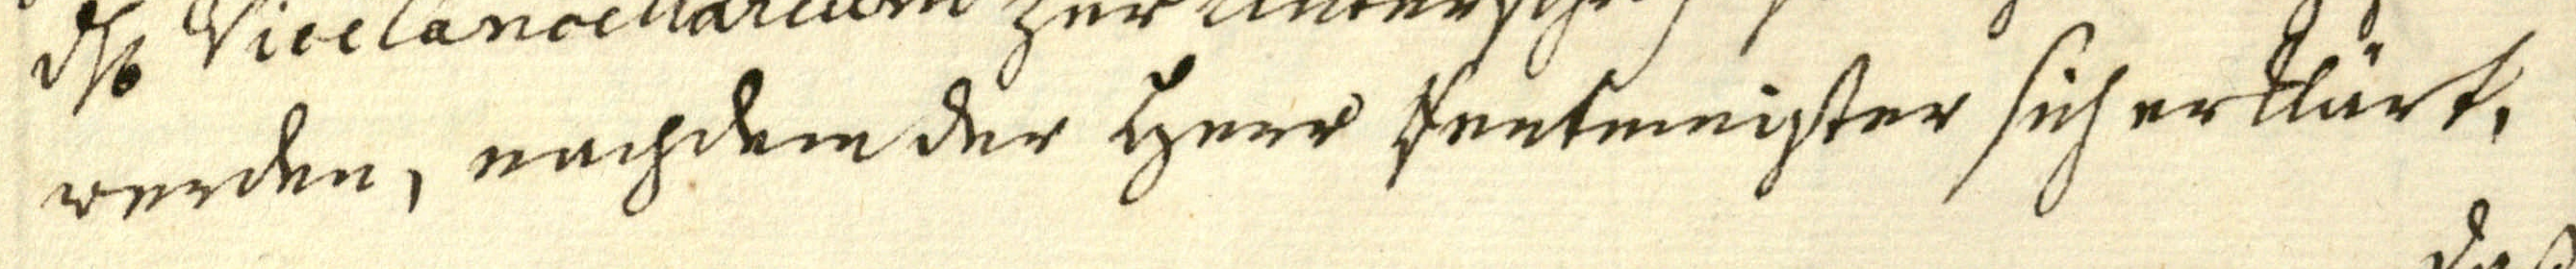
werden, nachdem der Herr Rentmeister sich erklärt,
